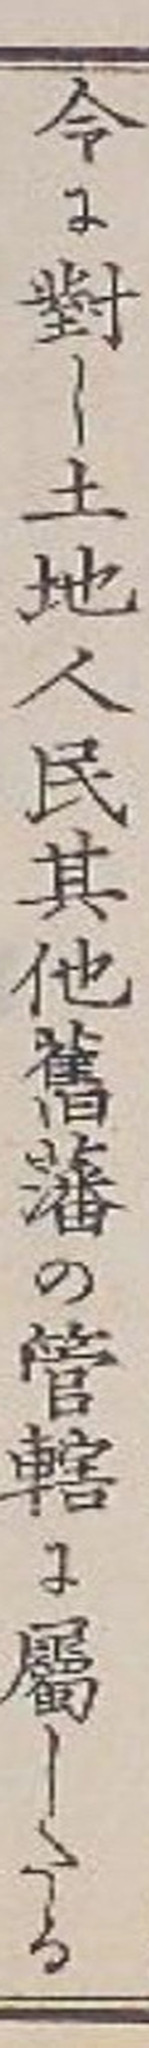令に対し土地人民其他旧藩の管轄に属したる
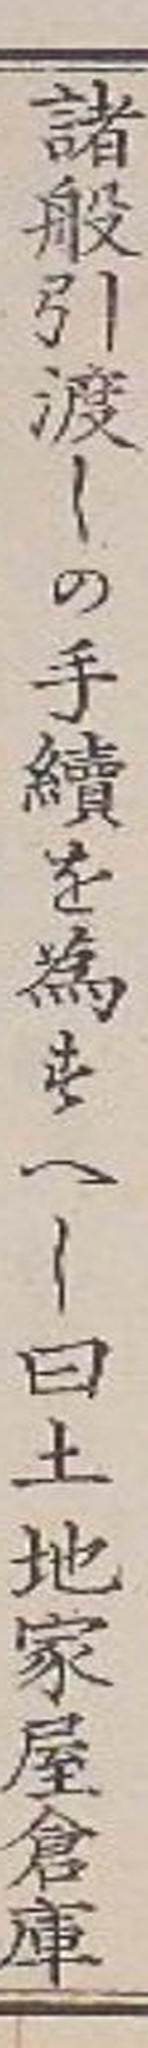諸般引渡しの手続を為すへし曰土地家屋倉庫
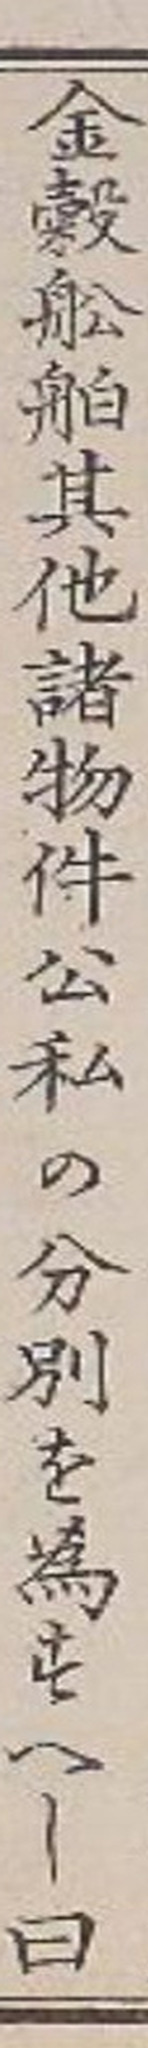全般船舶其他諸物件公私の分別を為すへし曰
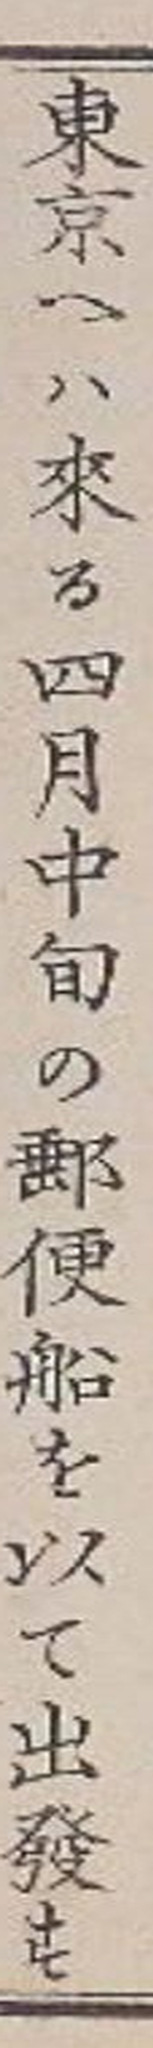東京へは来る四月中旬の郵便船を以て出発す
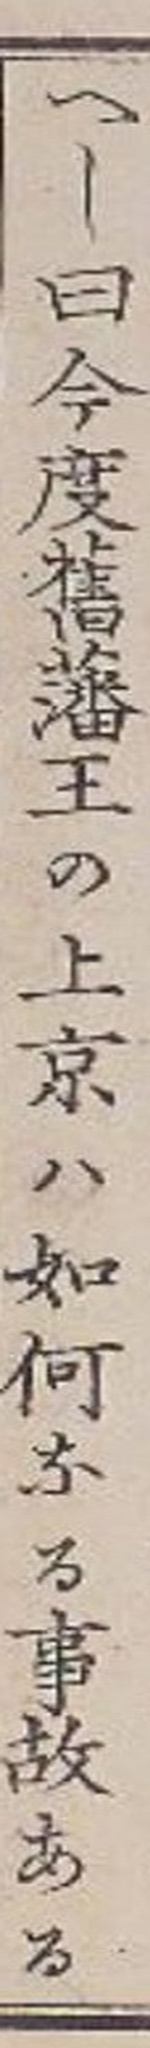へし曰今度旧藩王の上京は如何なる事故ある

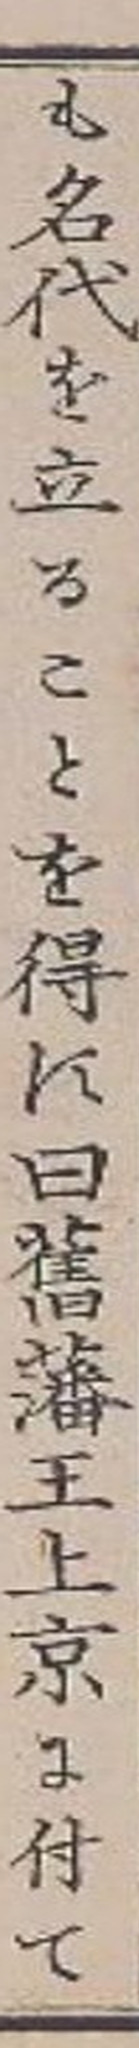も名代を立ることを得す曰旧藩王上京に付て
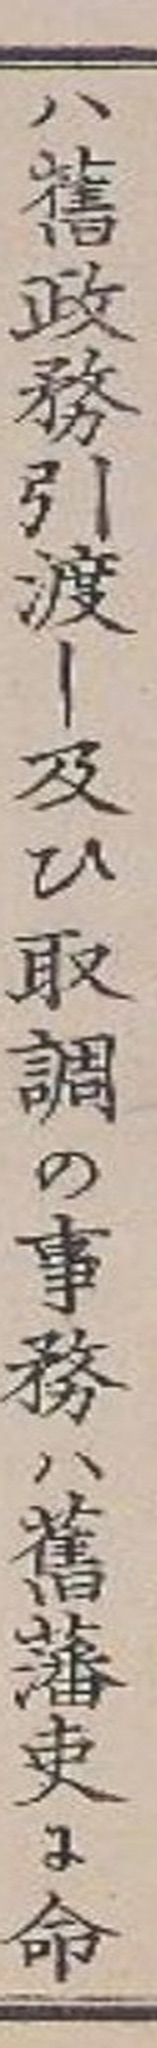は旧政務引渡し及ひ取調の事務は旧藩吏に命
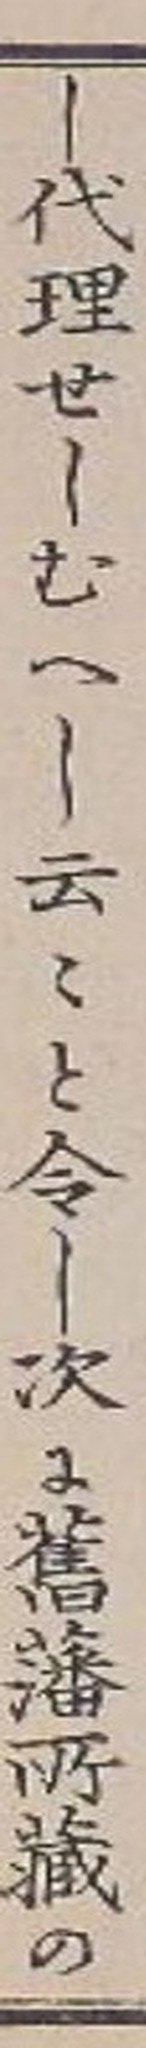し代理せしむへし云々と令し次に旧藩所蔵の
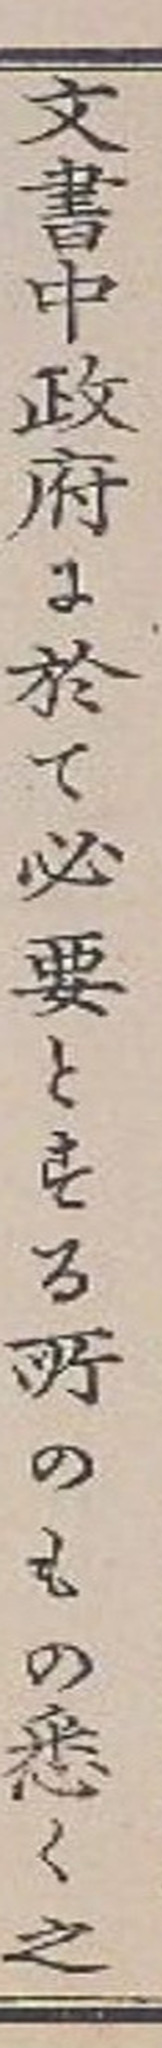文書中政府に於て必要とする所のもの悉く之
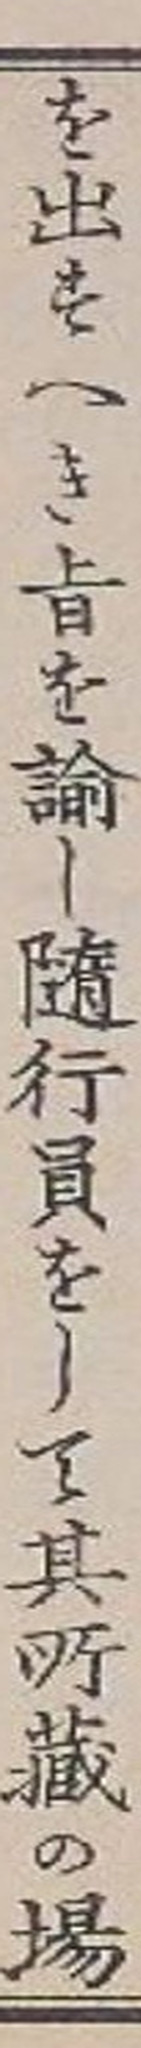を出すへき旨を諭し随行員をして其所蔵の場
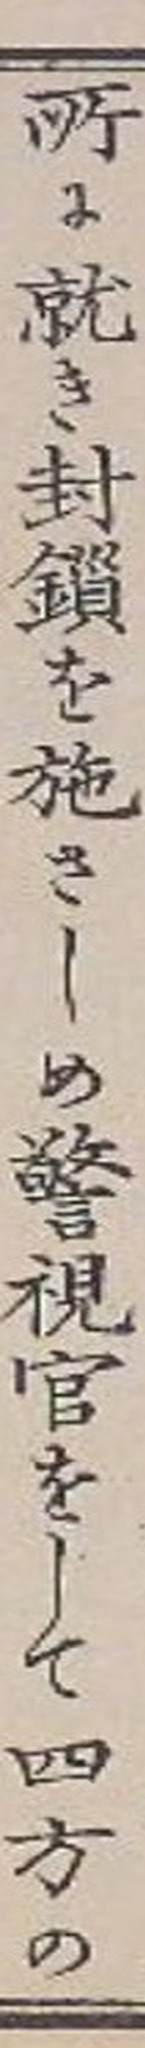所に就き封鎖を施さしめ警視官をして四方の
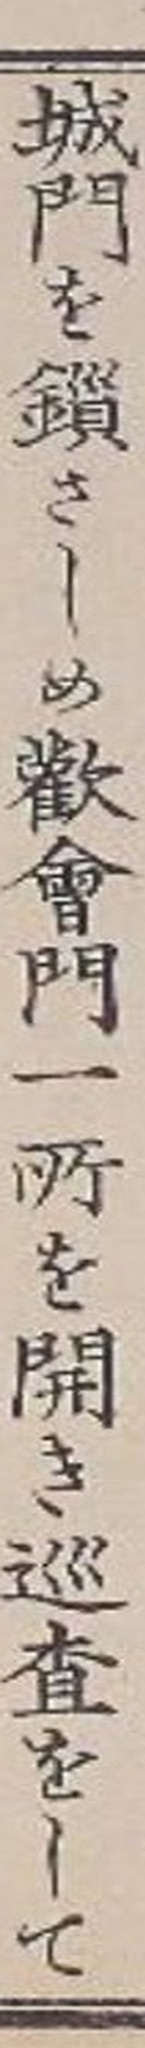城門を鎖さしめ歓会門一所を開き巡査をして
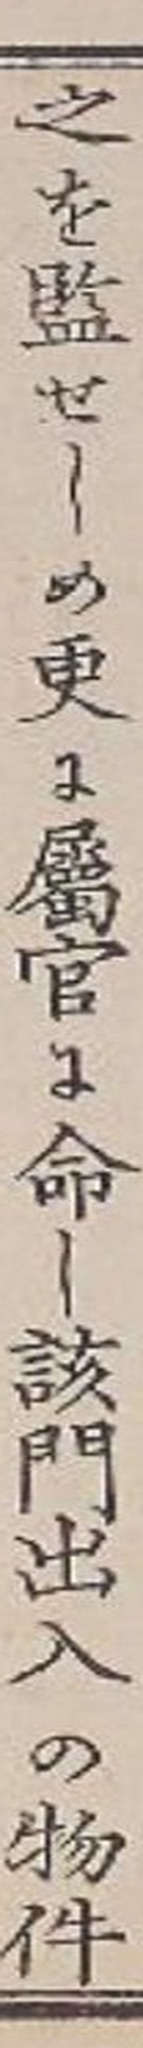之を監せしめ更に属官に命し該門出入の物件
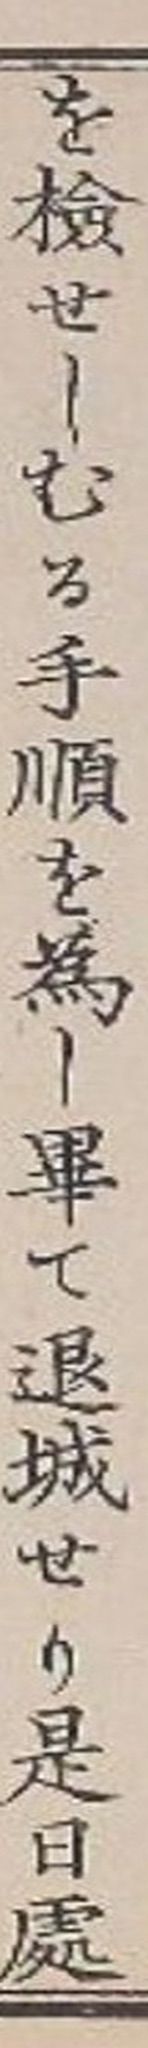を検せしむる手順を為し畢て退城せり是日処
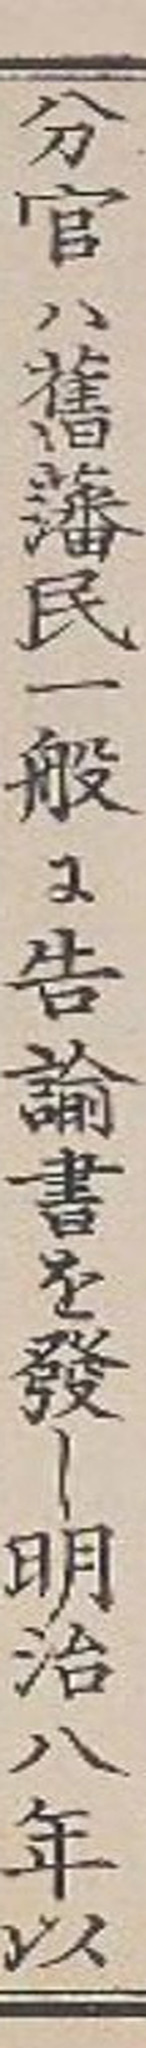分官は旧藩民一般に告諭書を発し明治八年以
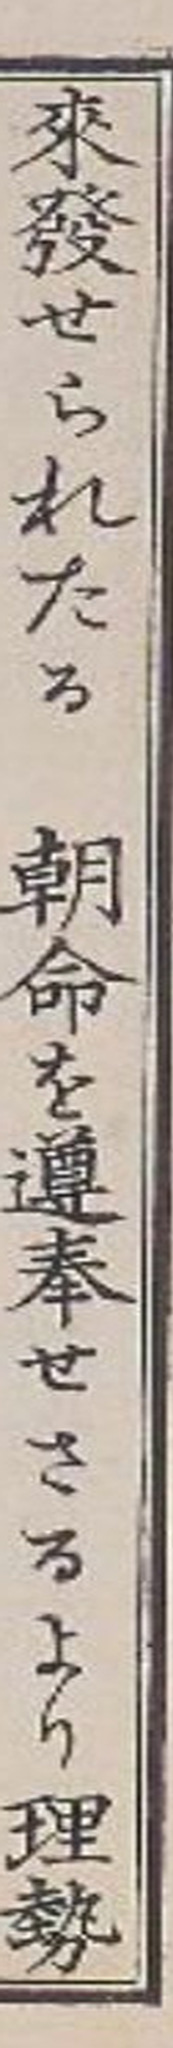来発せられたる朝命を遵奉せさるより理勢
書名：南島紀事 下
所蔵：University of the Ryukyus Library
